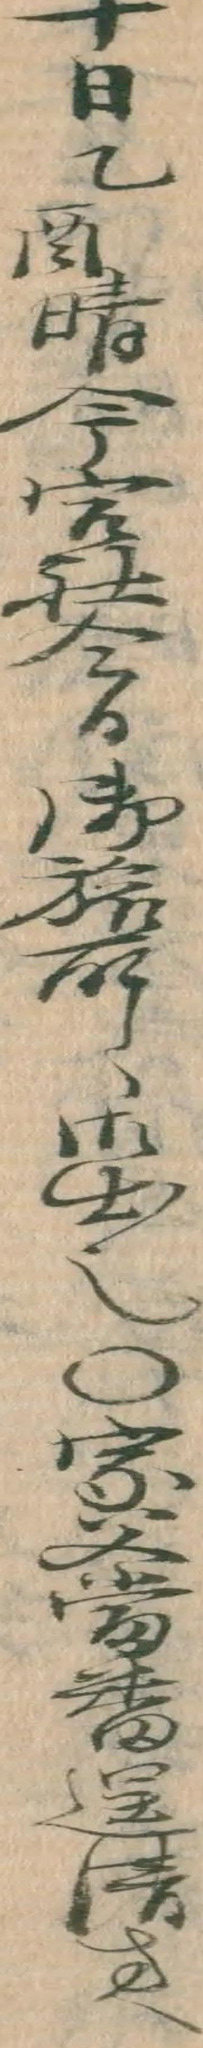十日乙酉晴今宮社今日御旅所へ御出也○家父當番逞清方へ
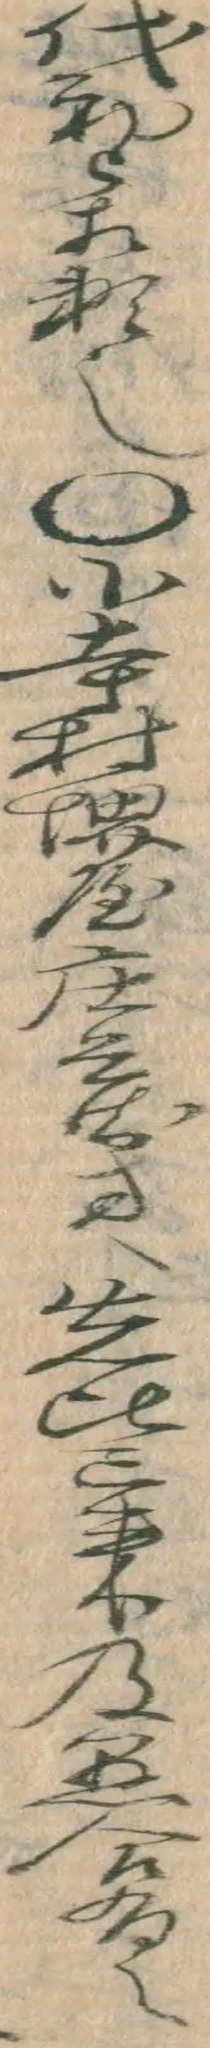代勤被相頼也○小寺村堺屋庄兵衛方へ先比已来不及懸合有之
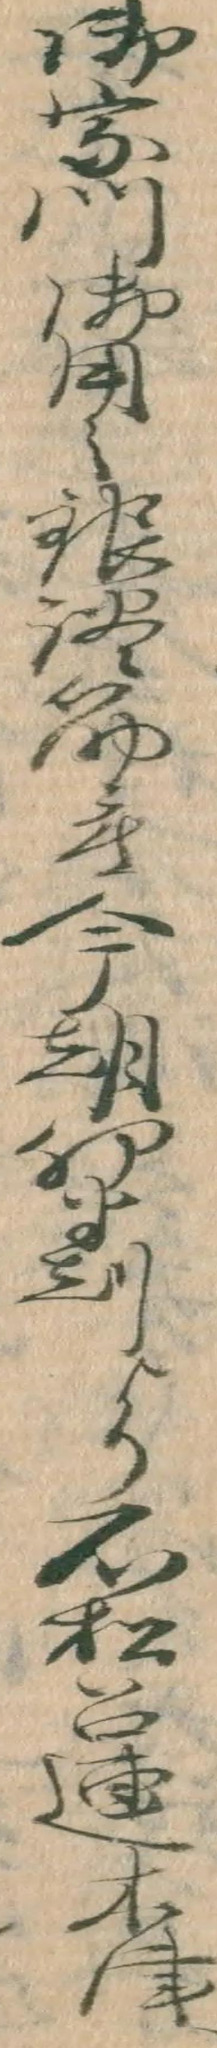御家門御用之銀談筋ニ付今朝卯半刻より石松召連木津
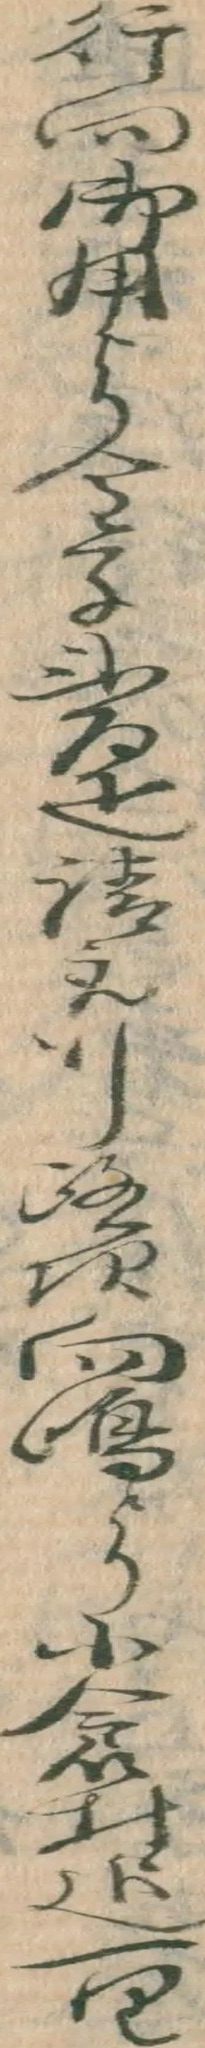行向御用より金子弐百疋請取行路次向嶋より小倉村迄一里
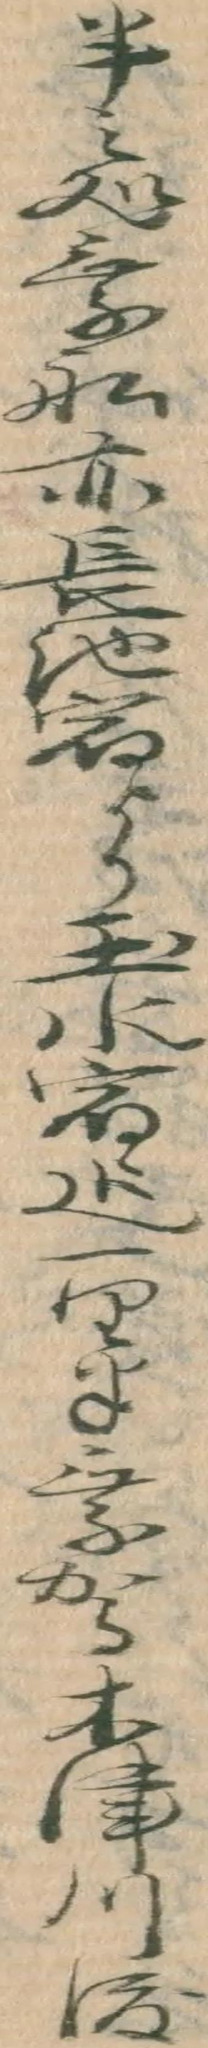半之処乗舩亦長池宿より玉水宿迄一里半乗駕木津川渡
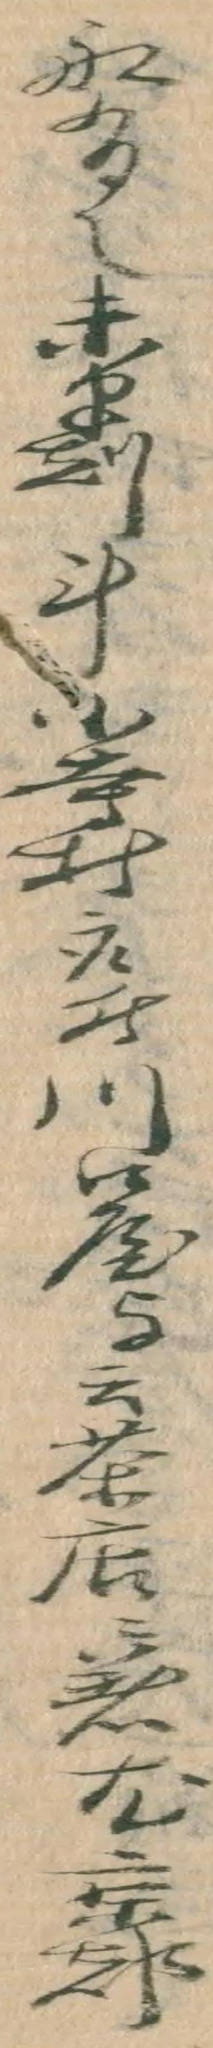舩有之未半刻斗小寺村取片川口屋と云茶店に着尤京都
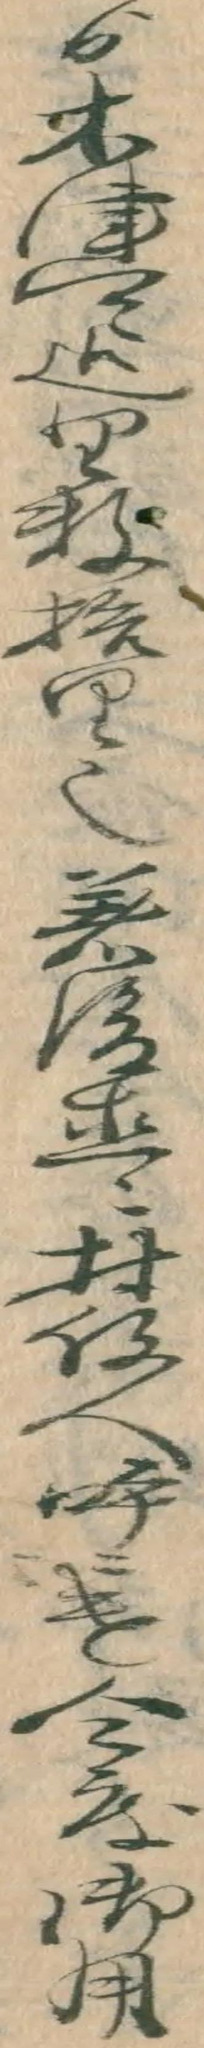ゟ木津口迄里数拾里也着後直ニ村役人呼ニ遣今度御用
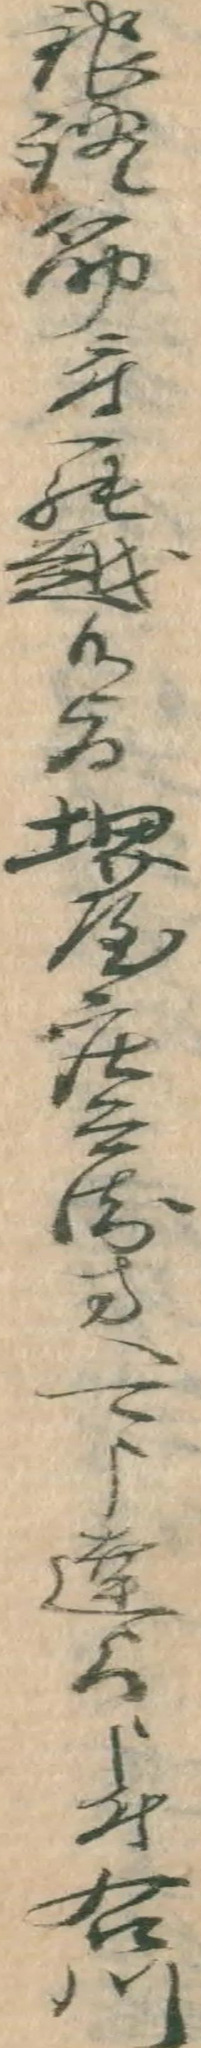銀證筋ニ付罷越候旨堺屋庄兵衛方へ可申達候旨申付右川

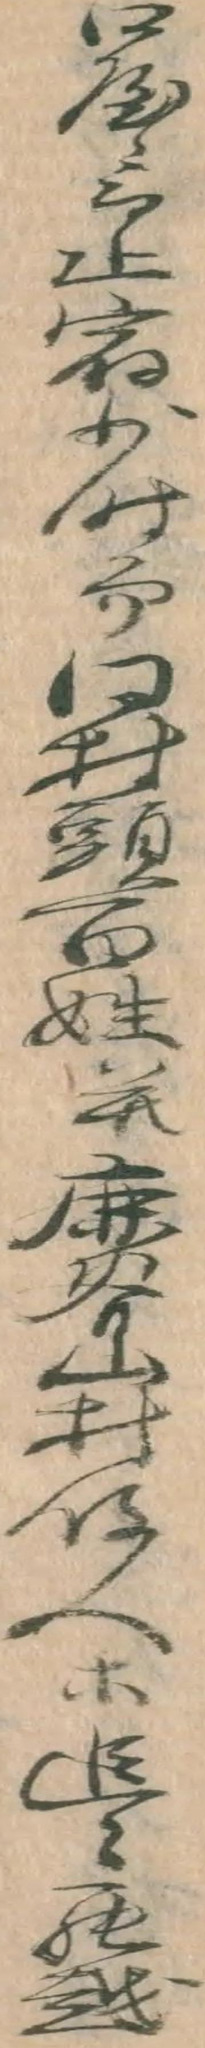口屋ニ而止宿少時而同村頭百姓并鹿谷山村役人等追々罷越
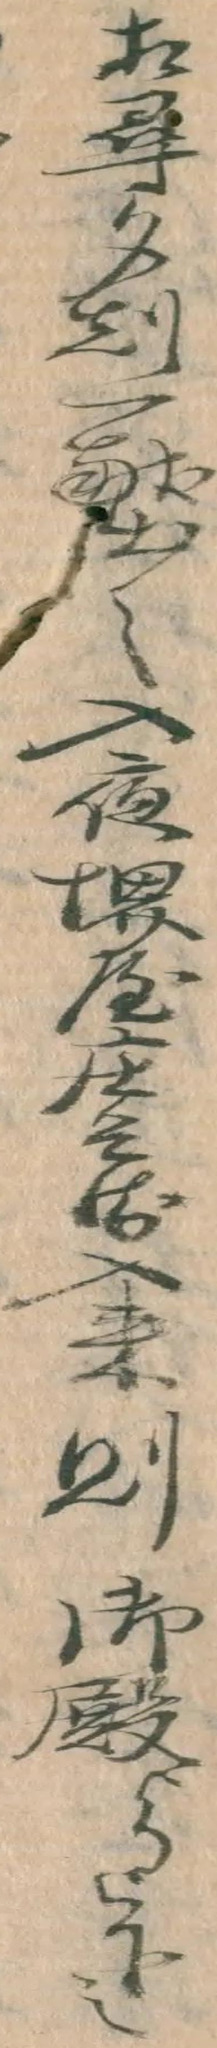相尋夕刻一献出也入夜堺屋庄兵衛入来則御殿より被下之
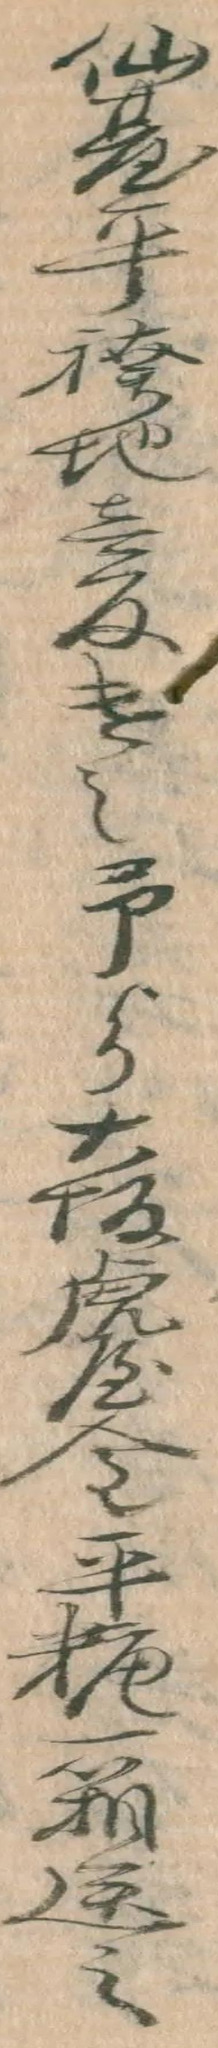仙䑓平袴地壱反遣之予より大坂虎屋金平糖一箱送之
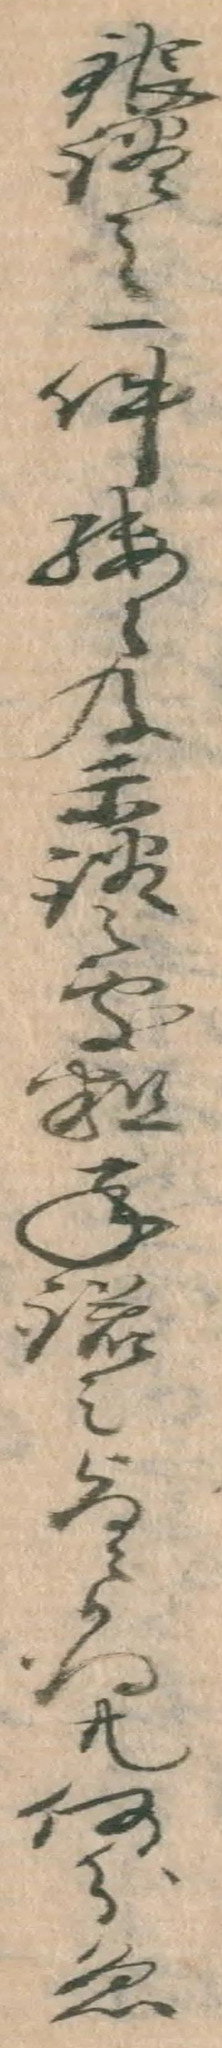銀談之一件残候及示談之處数領承諾之旨ニ候得共何分急
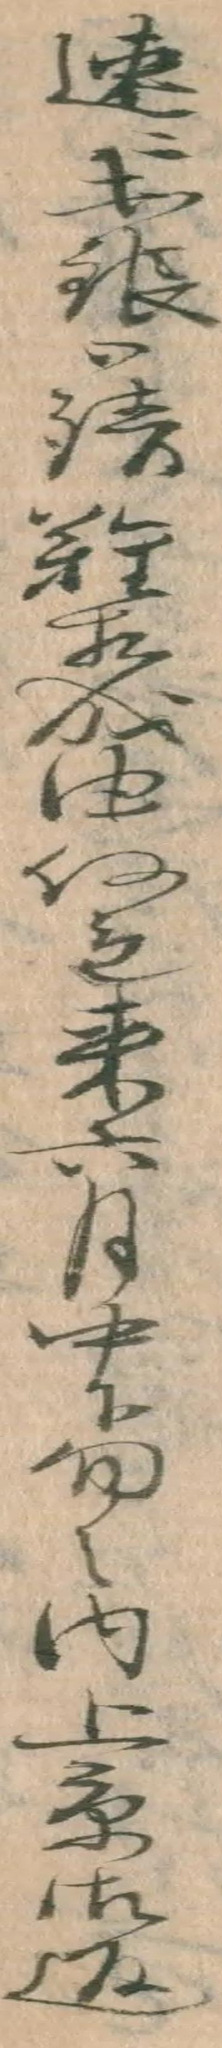速ニ出銀御請難相成由何れ来六月中下旬之内上京御返
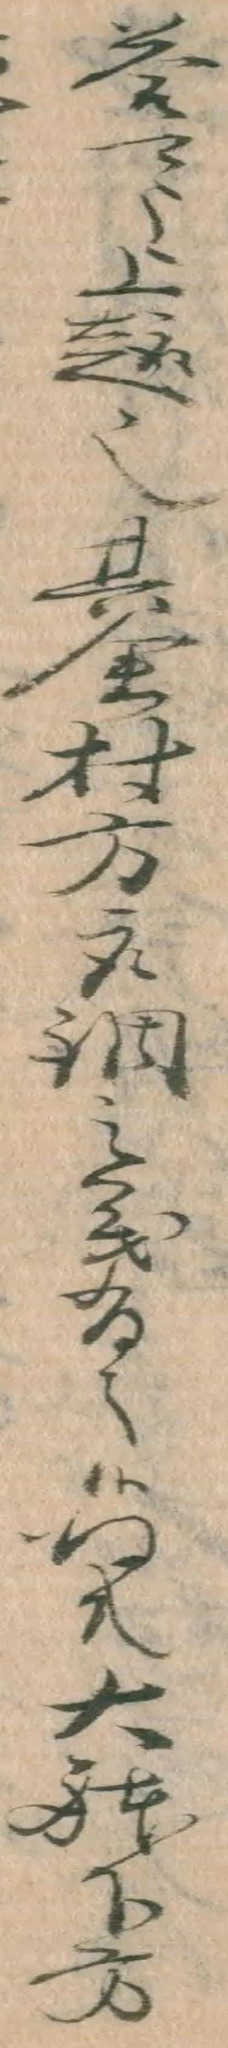答可申上趣也其金村方取調之義有之候得共大躰下方
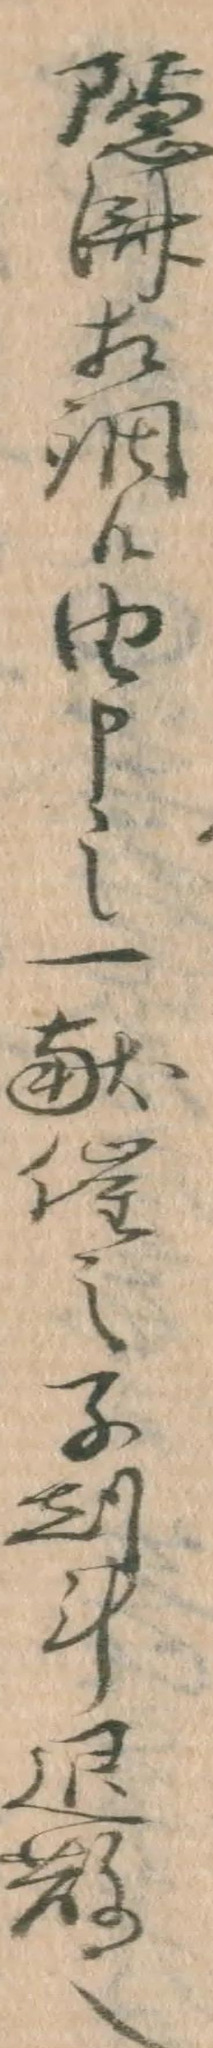隠済相調候由申候也一献催也子刻斗退散也
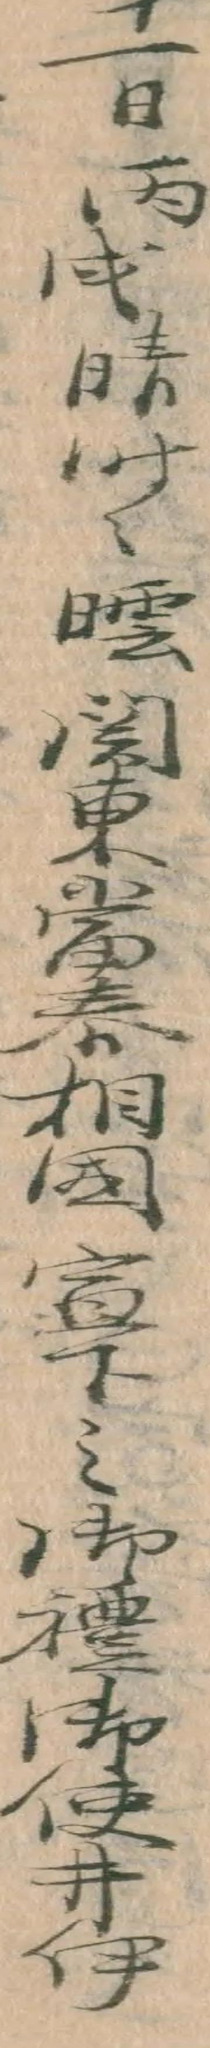十一日丙戌晴時々曇関東當春相國宣下之御禮御使井伊
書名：賀茂社記録. 第65冊
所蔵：国立国会図書館 National Diet Library, JAPAN
